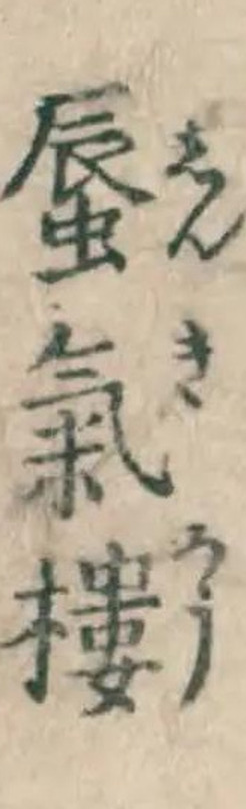蜃気楼
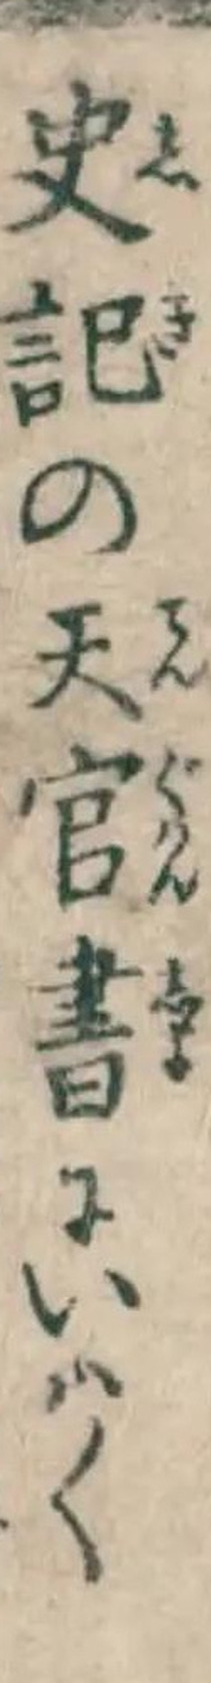史記の天官書にいはく
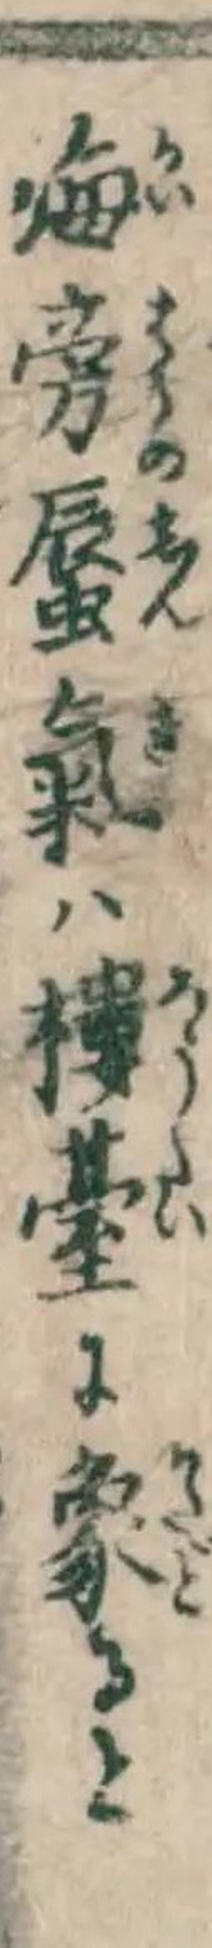海旁蜃気は楼台に象ると
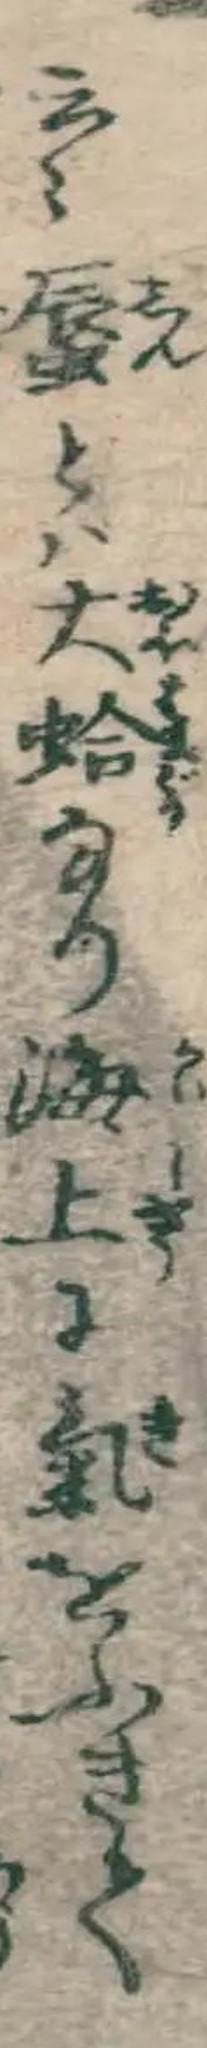云々蜃とは大蛤なり海上に気をふきて
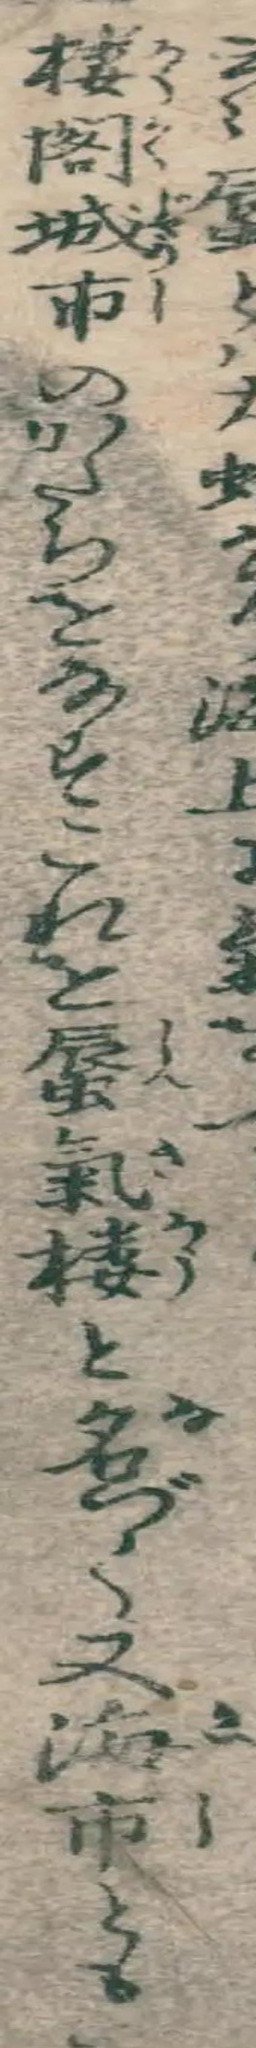楼閣城市のかたちをなすこれを蜃気楼と名づく又海市とも言

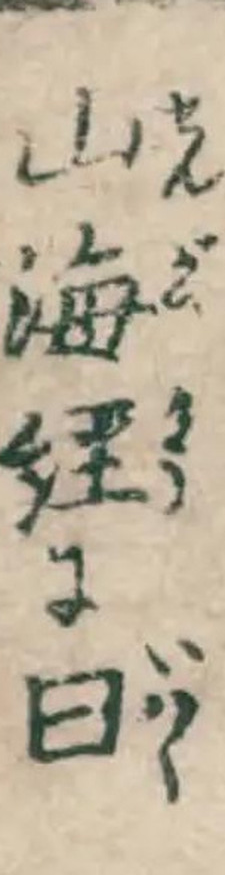山海経に曰
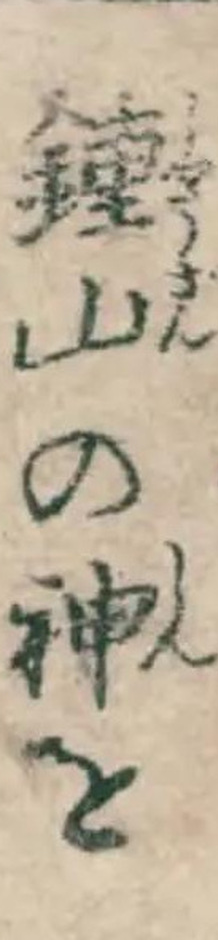鍾山の神を
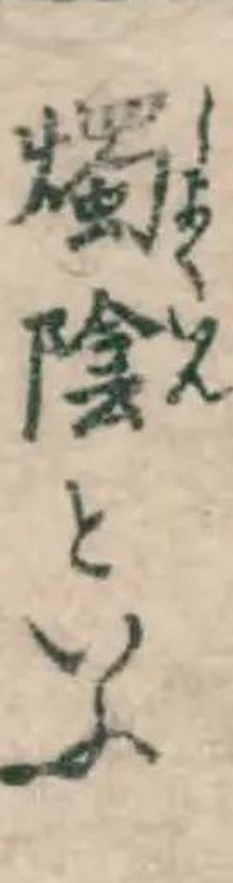燭陰といふ
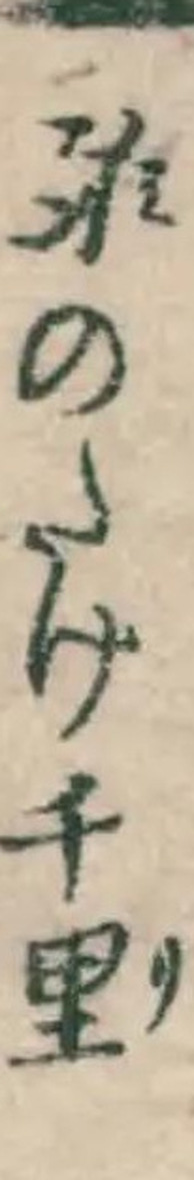身のたけ千里
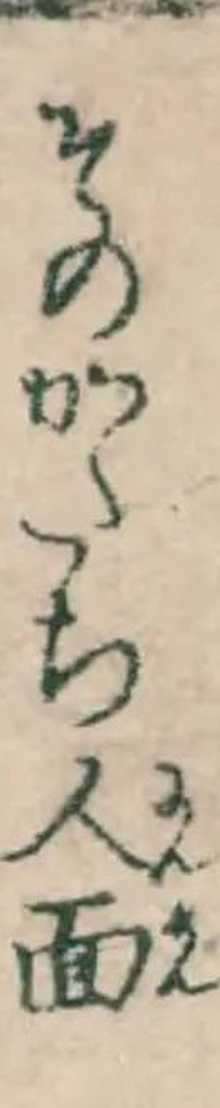そのかたち人面
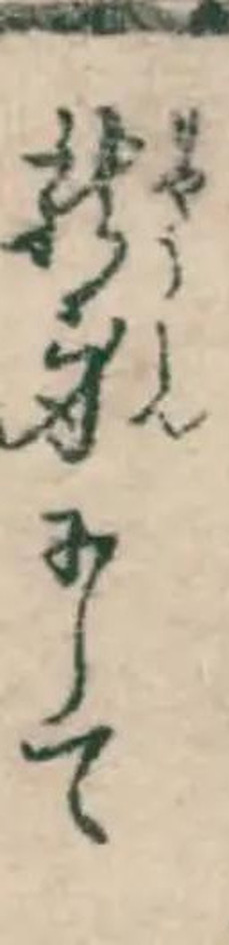龍身にして
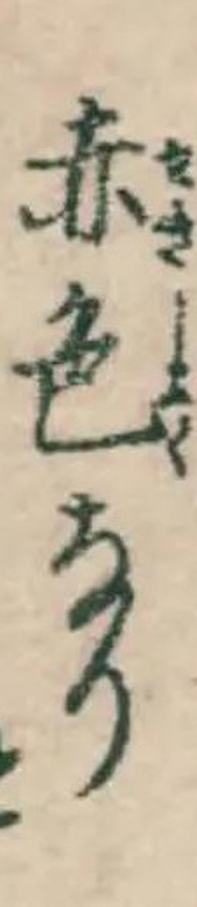赤色なりと
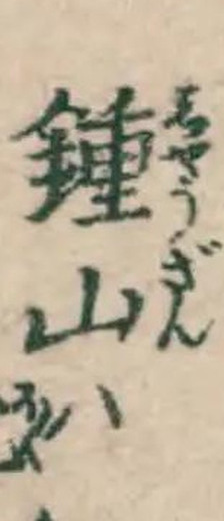鍾山は
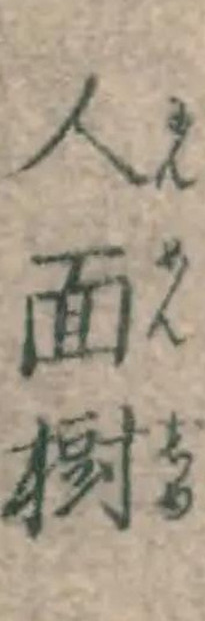人面樹
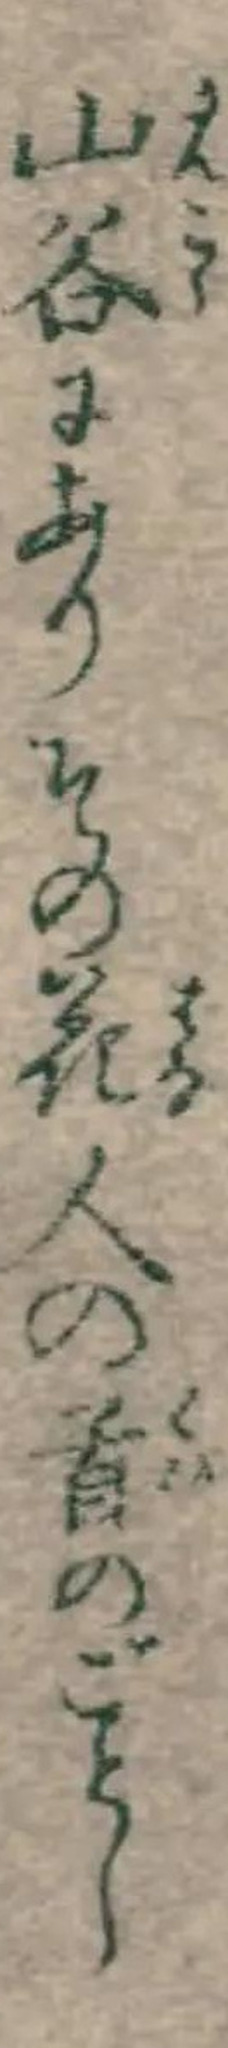山谷にありその花人の首のごとし
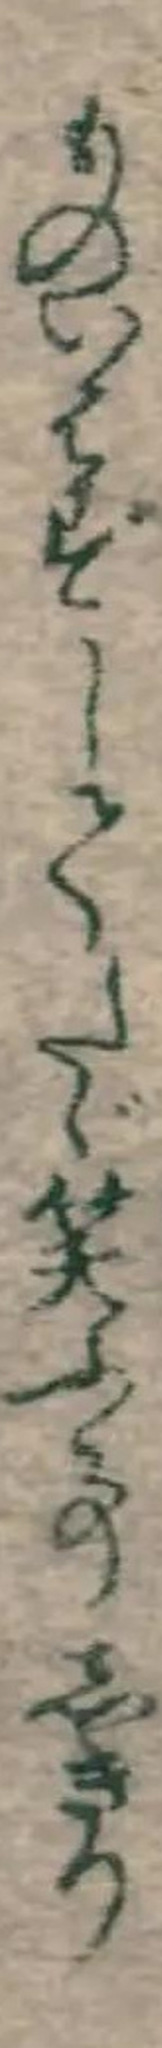ものいはずしてたゞ笑ふ事しきり
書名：百鬼夜行 3巻拾遺3巻. [2]
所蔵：国立国会図書館 National Diet Library, JAPAN
